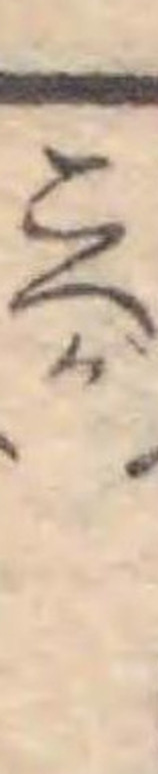こへが
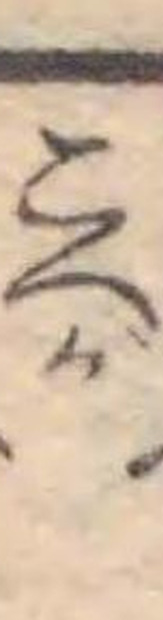こへが
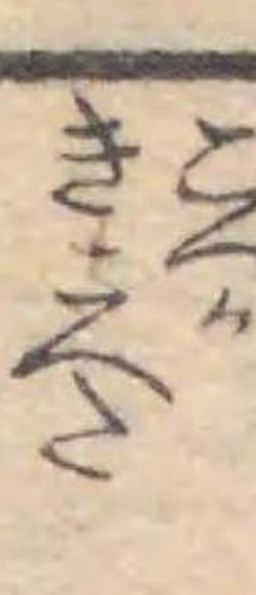きこへた
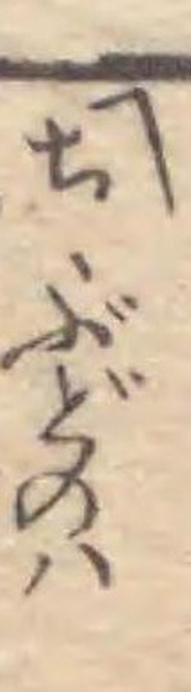〽ちゝぶどのは
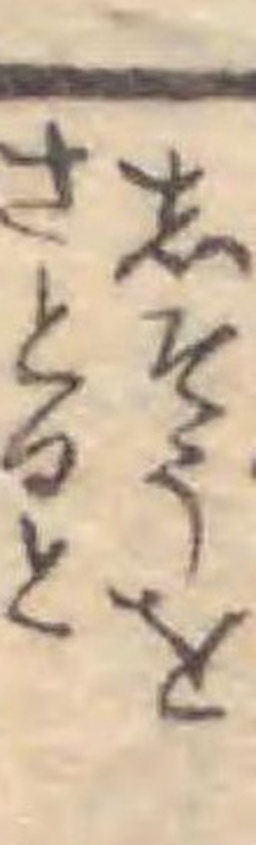さとると
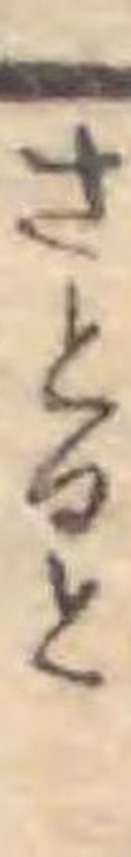さとると
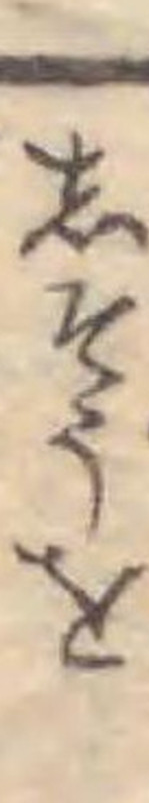しそうを
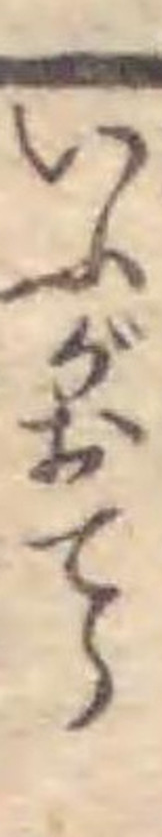いふがおてら
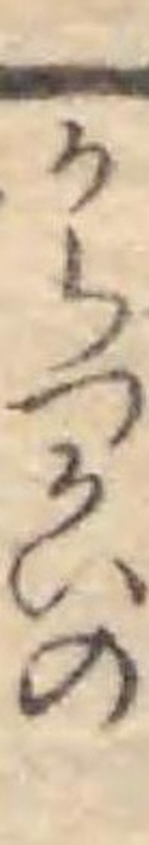からつかいの
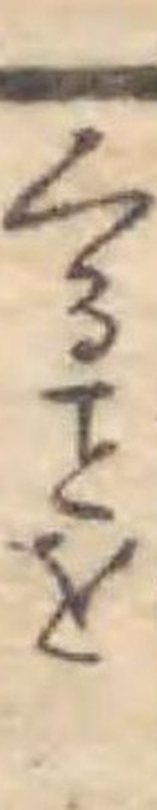くることを
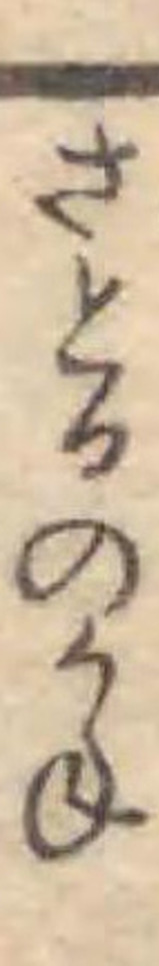さとるのかね
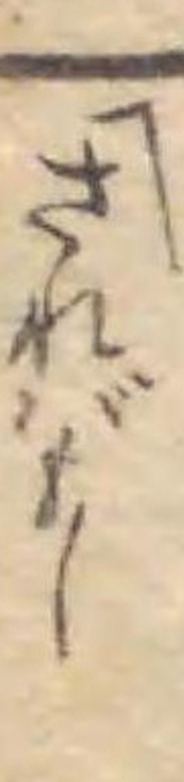〽さればもし
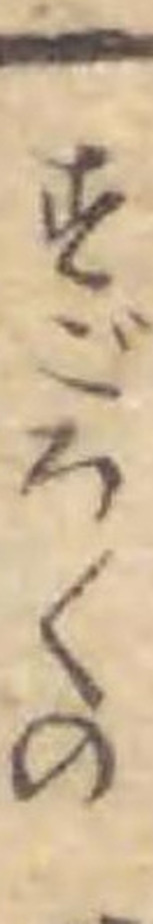すごろくの
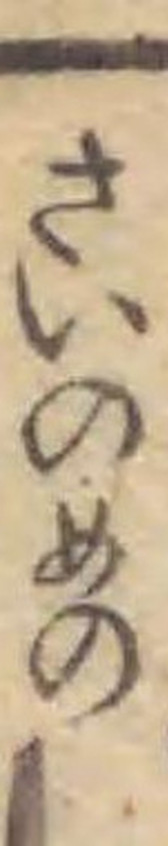さいのめの
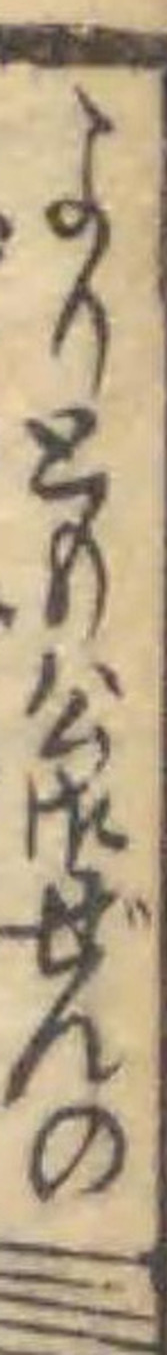よりとも公御ぜんの
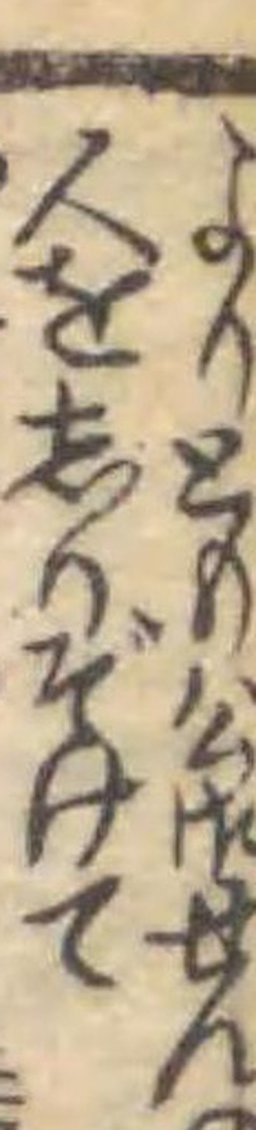人をしろぞけて
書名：文武二道万石通 : 3巻
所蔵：国立国会図書館 National Diet Library, JAPAN
